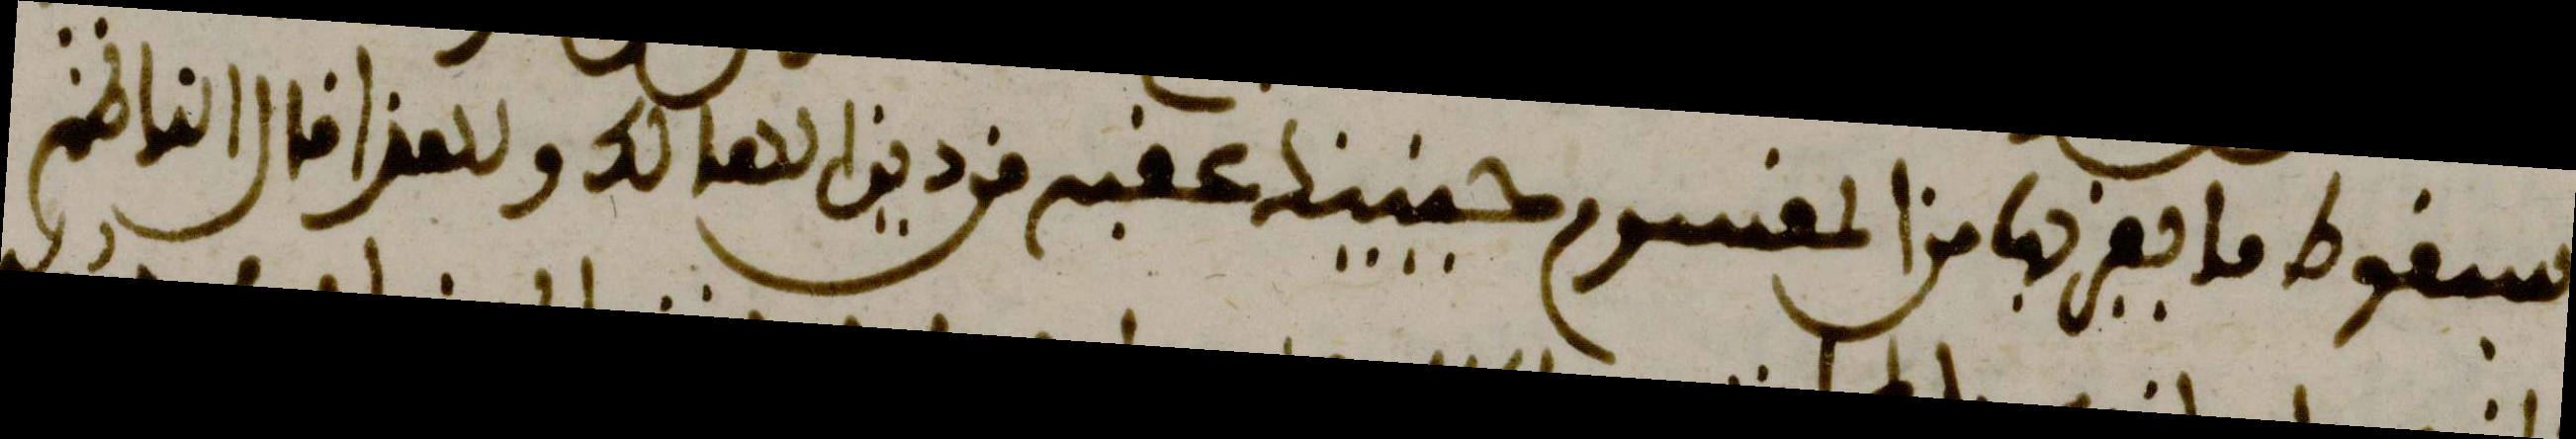بسقوط ما ينوي بها من المقسوم حينيذ عنه من دين الهالك ولهذا قال الناظم
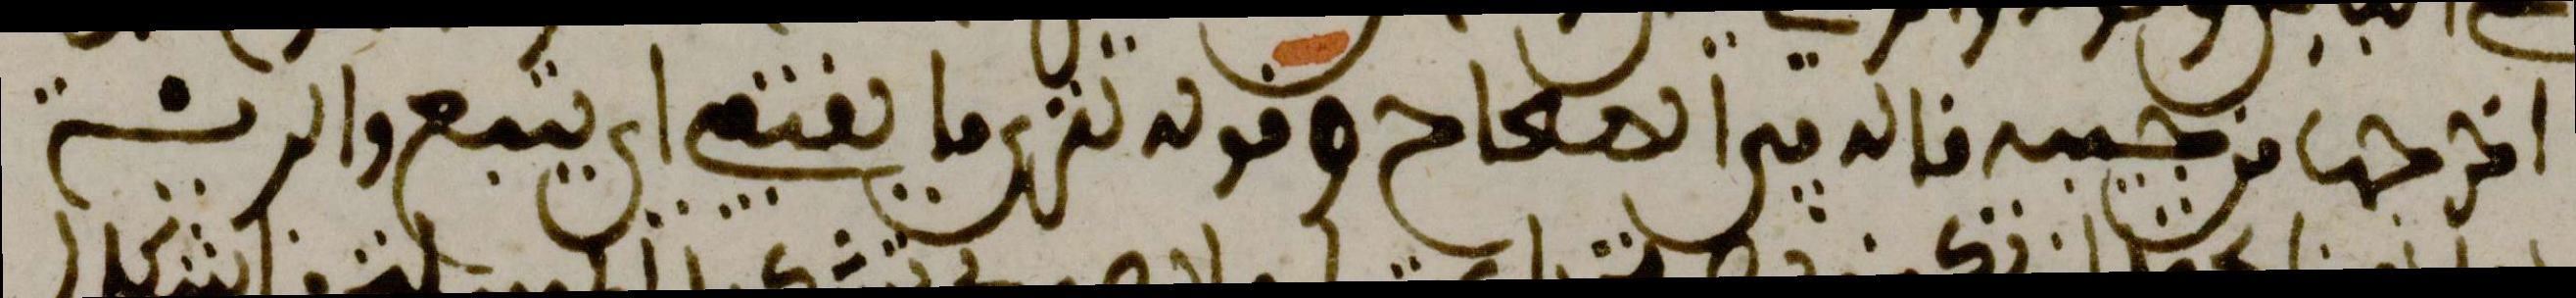اخرجها من جيبه قاله في الصحاح وَقوله لتري ما يقتفي اي يتبع والرئية
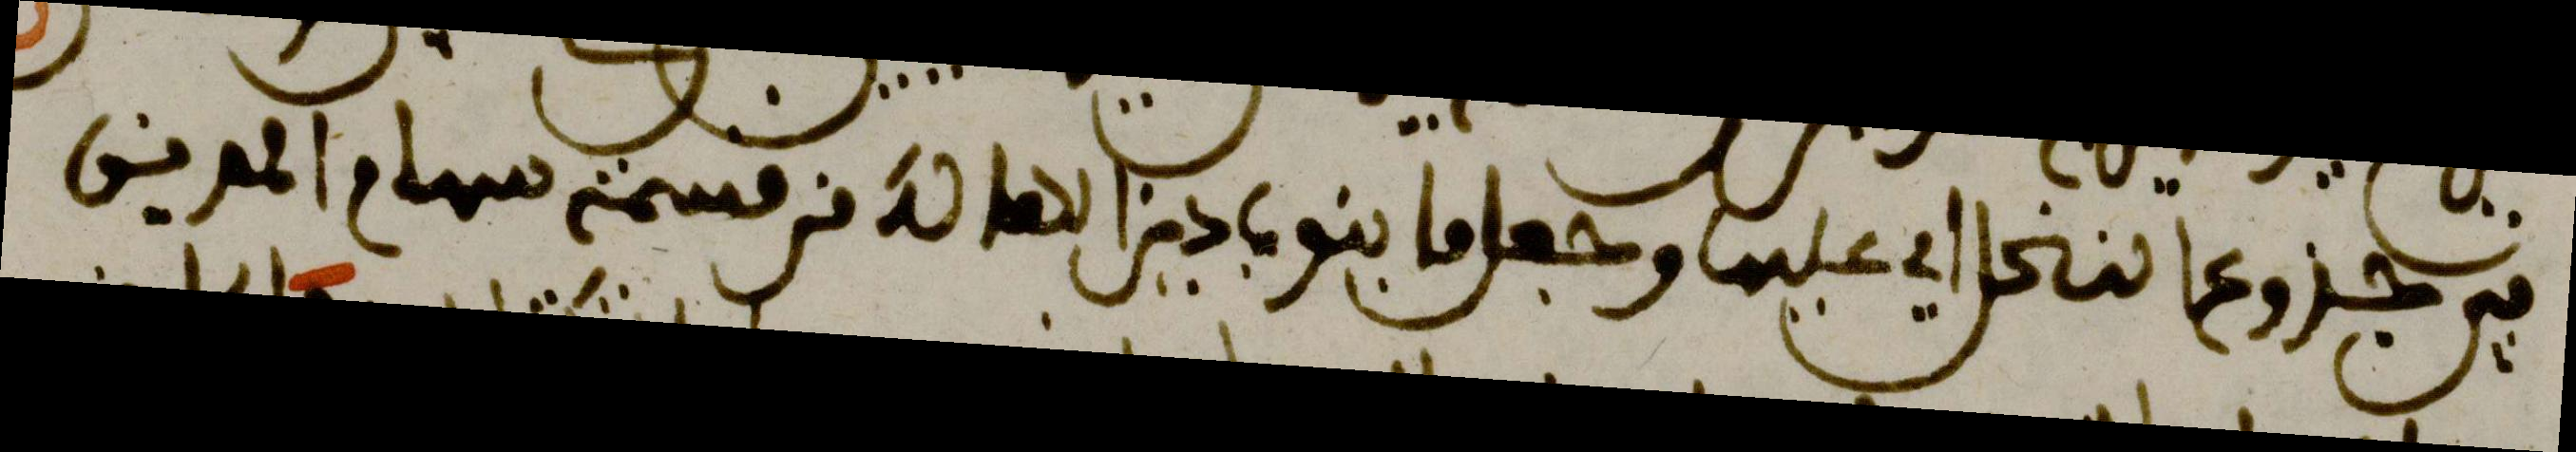في جذوع النخل اي عليها وجعل ما ينوب دين الهالك من قسمة سهام المدين
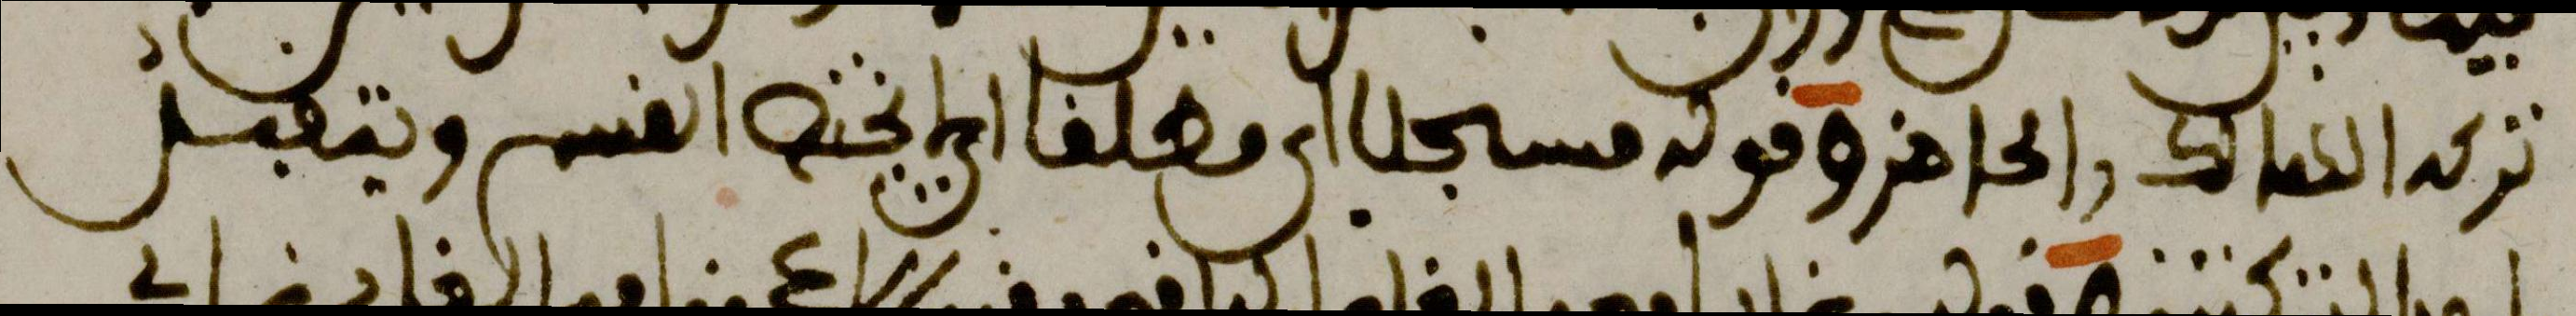تركه الهالك والحاضر وَقوله مسجلا اي مطلقا اي لا يختص القسم ويتقيد
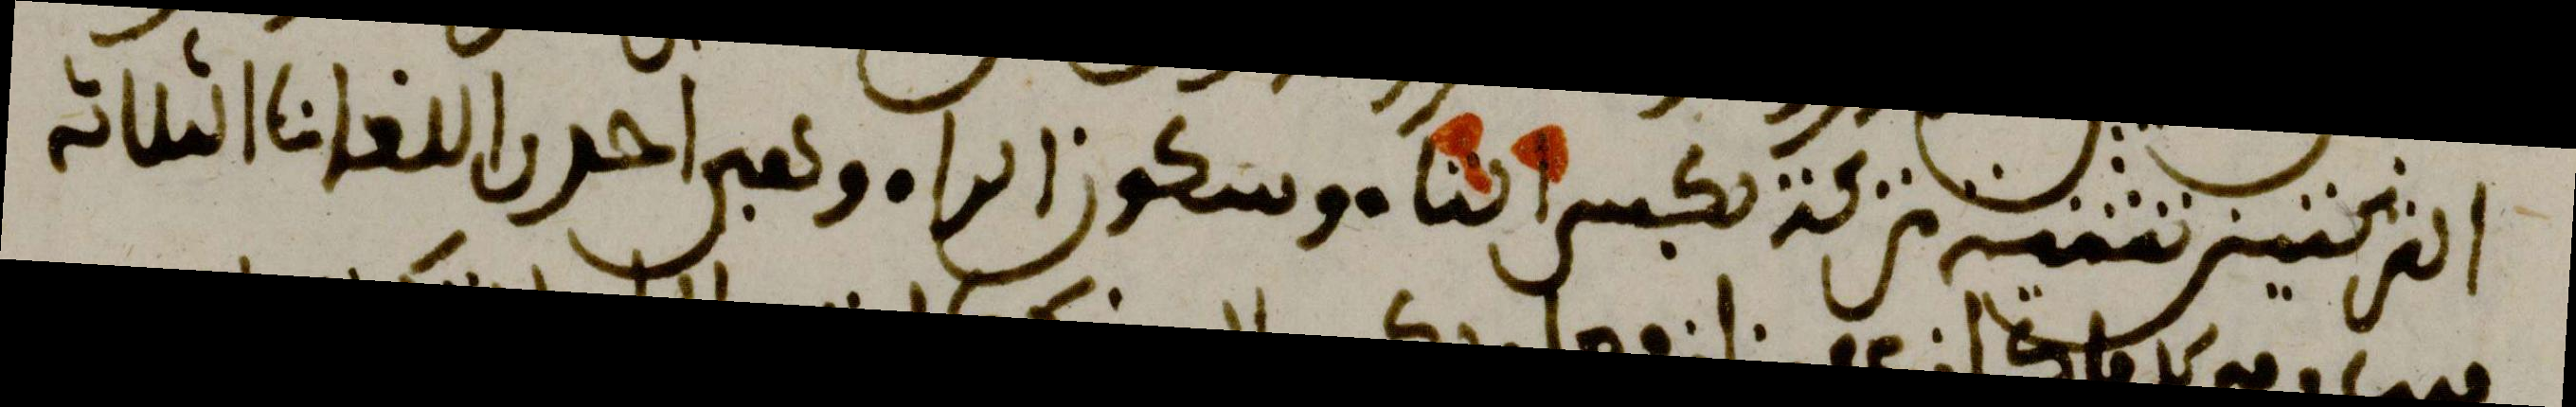التركتين تثنية تركة بكسر التاء وسكون الراء وهي احدى اللغات الثلاثة
